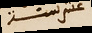عشر سنة
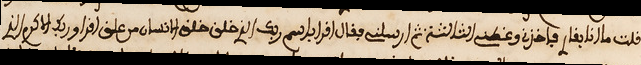قلت ما انا بقارى فاخذنى وغطنى الثالثة ثم ارسلنى فقال اقرا باسم ربك الذي خلق الانسان من علق اقرا وربك الاكرم الذي
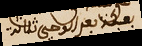يمكة بعد الوحي ثلاثة
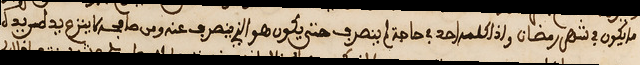ما يكون في شهر رمضان واذا كلمه احد في حاجة لم ينصرف حتى يكون هو الذي ينصرف عنه ومن صافحه لا ينزع يده من يده
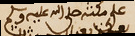على مكثه صلى الله عليه وسلم
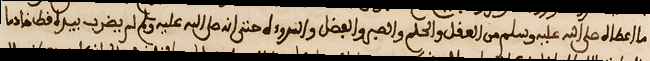ما اعطاه صلى الله عليه وسلم من العقل والحلم والصبر والفضل والسروءه حتى انه صلى الله عليه وسلم لم يضرب بيده قط خادما
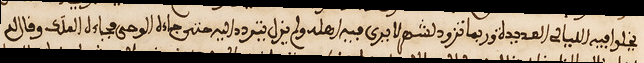يخلوا فيه الليالى العديدة وربما تزود لشهر لا يرى فيه اهله ولم يزل يتردد اليه حتى جاءه الوحى فجاءه الملك وقال له
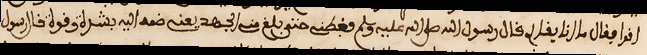اقوا فقال ما انا يقارى قال رسول الله صلى الله عليه وسلم فغطنى حتى بلغ منى الجهد يعنى ضمه اليه بشرة وقوة قال رسول
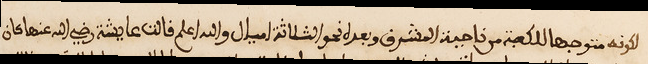لكنه متوجها للكعبة من ناحية المشرق وبعده نحو الثلاثة اميال والله اعلم قالت عايشة رضي الله عنها كان
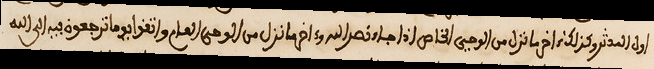اول المدثر و كذلك ءاخر ما نزل من الوحي الخاص اذا جاء نصر الله وءاخر ما نزل من الوحي العام واتقوا يوما ترجعوه بيه الى الله
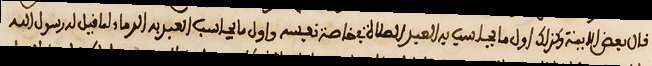قال بعض الايمة وكذلك اول ما يحاسب به العبد الصلاة في خاصة نفسه واول ما يحاسب العبد به الرماء لما قيل له رسول الله
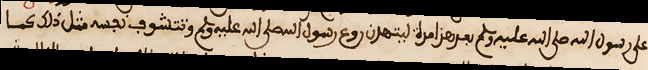على رسول الله صلى الله عليه وسلم بعد هزامرة ليتهدن روع رسول الله صلى الله عليه وسلم وتتشوف بنفسه مثل ذلك كما
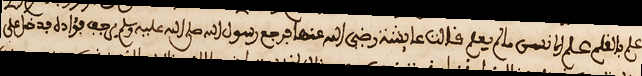علم بالقلم علم الانسن ما لم يعلم قالت عائشة رضي الله عنها فرجع رسول الله صلى الله عليه وسلم يرجف فؤاده فدخل على
